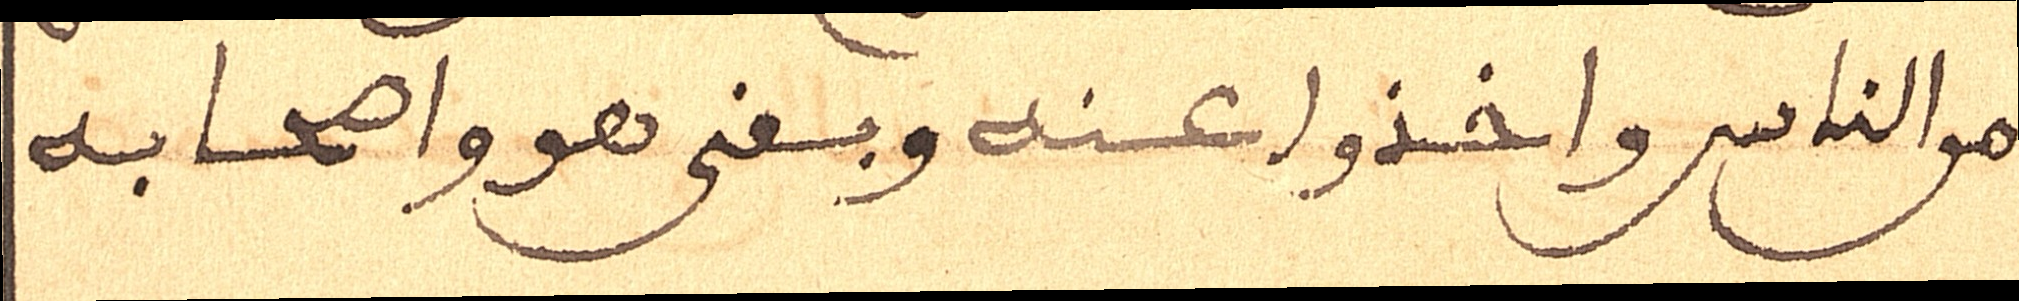من الناس واخذ واعنه وبقى هو واصحابه
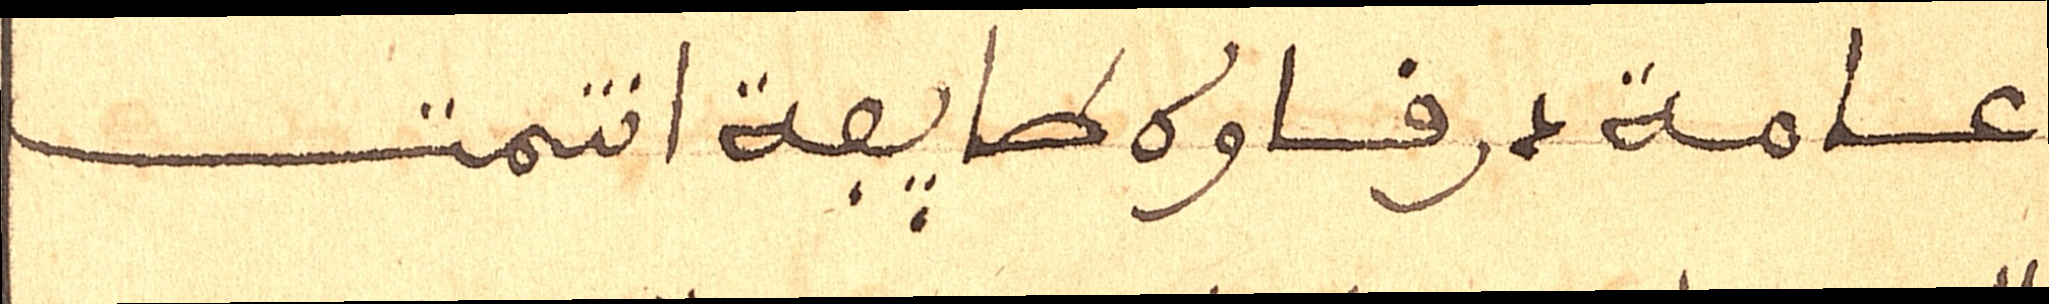عامة درقاوه طائفة انتمت
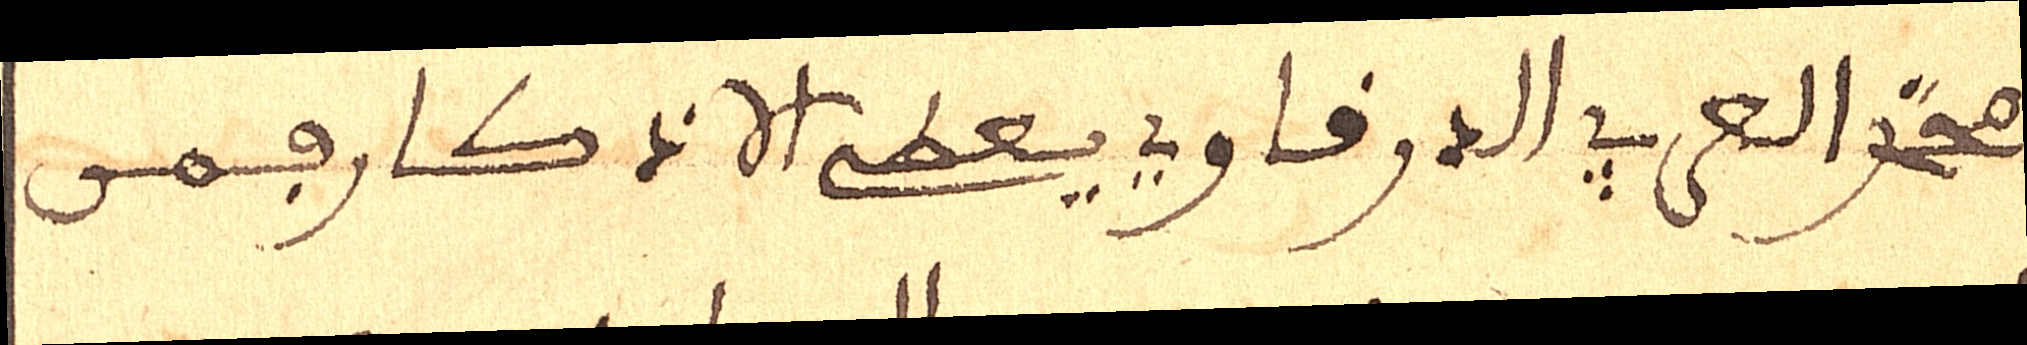محمد العربي الدرقاوي يعطى الا ذكار فمن
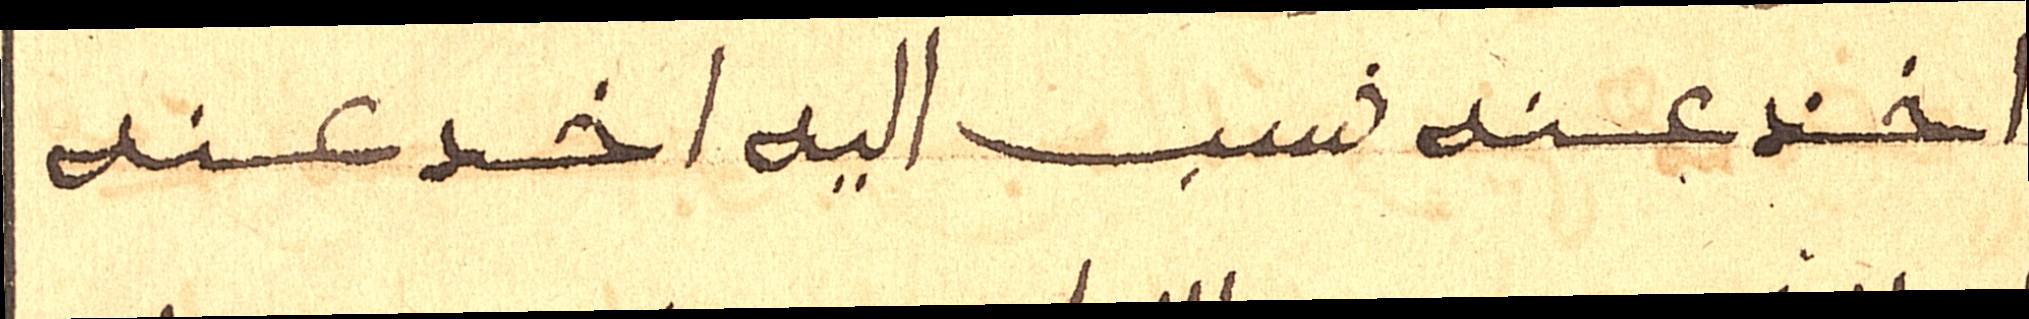اخذ عنه نسب اليه اخد عنه
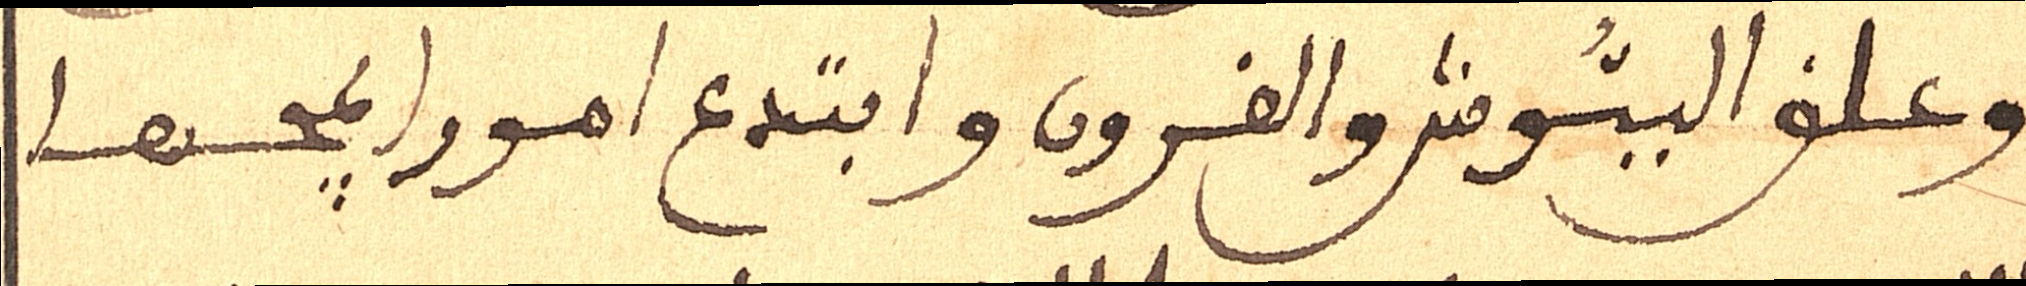وعلق اليثوش والقرون وابتدع امورا يمجها
